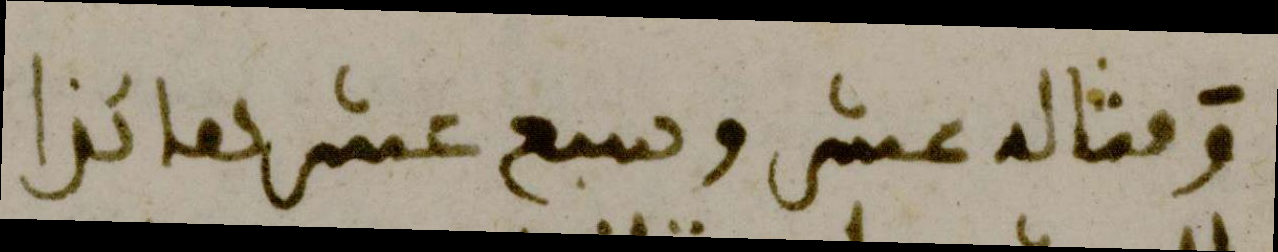و مثاله عشر و سبع عشر هاكذا
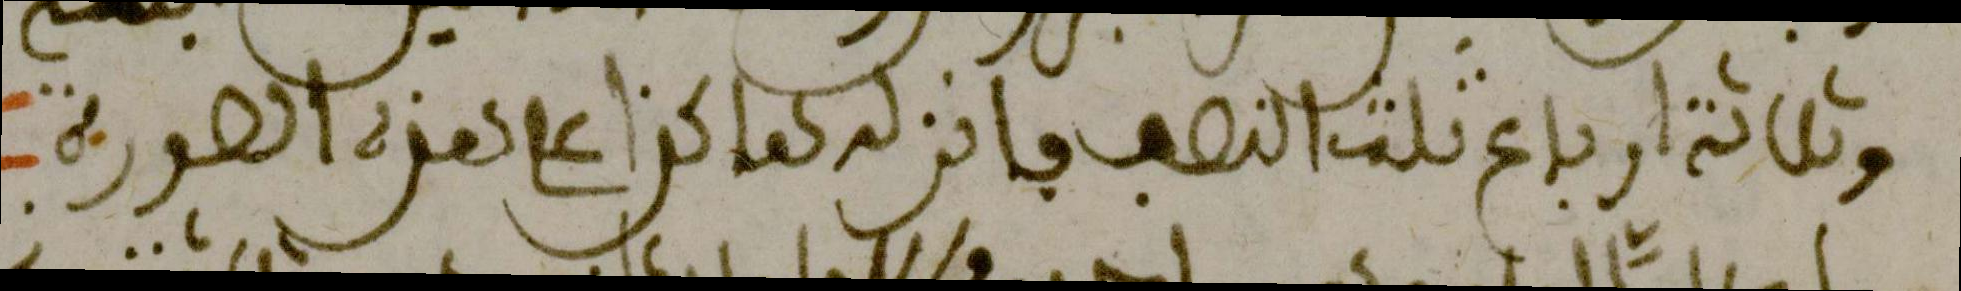و ثلاثة ارباع ثلث النصف فانزله هاكذا على هذه الصورة
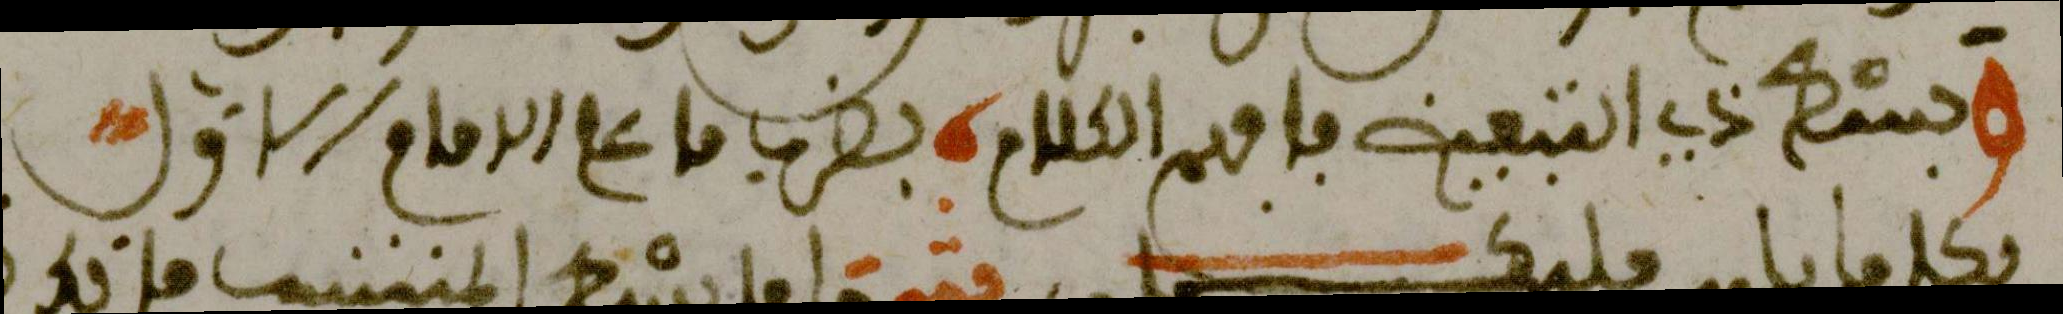و بسط ذي التبعيض فافهم الكلام بضرب ما على الامام الاول
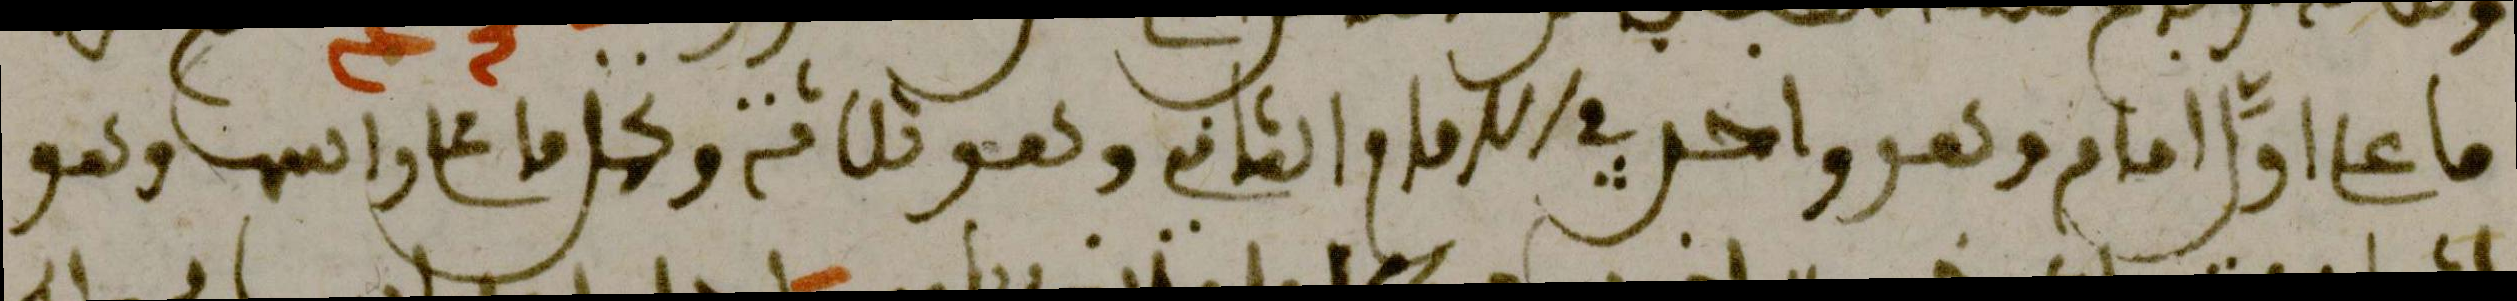ما على اوّل امام و هو واحد في الامام الثاني و هو ثلاثة و تحمل ما على راسها و هو
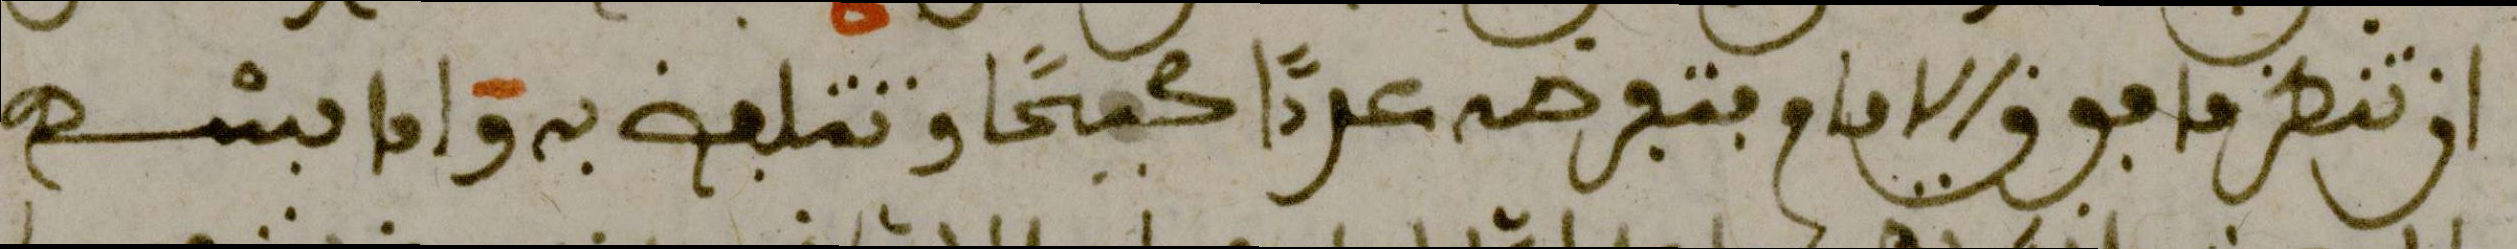ان تنظر ما فوق الامام فتفرضه عددا صحيحا و تتلفض به و اما بسط
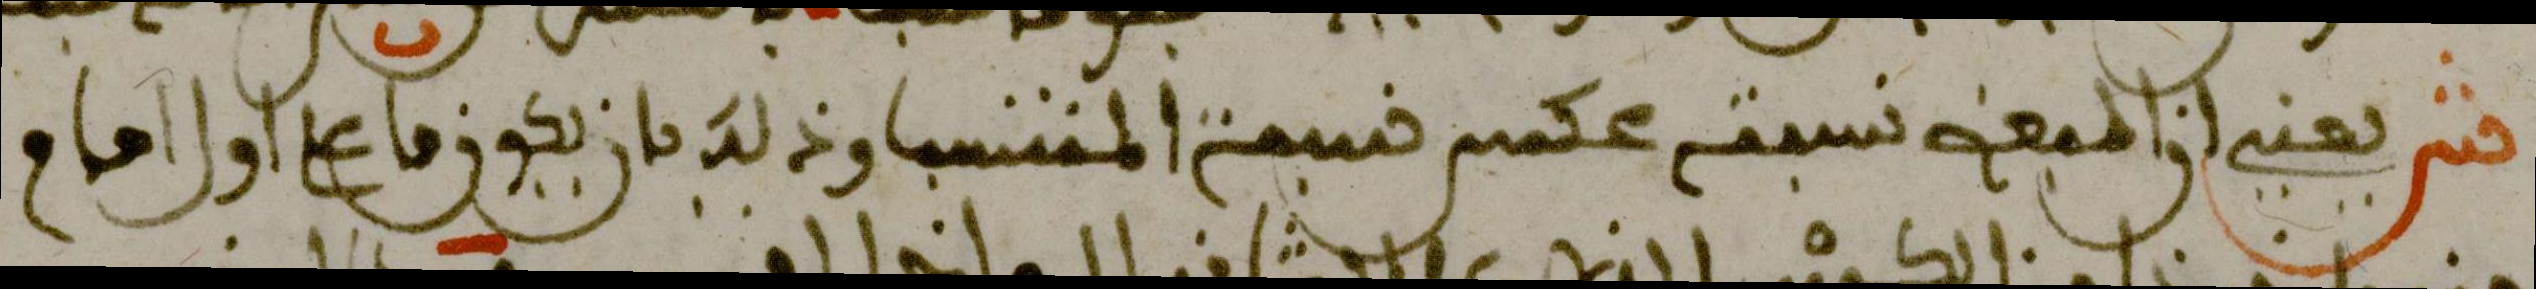ش يعني ان المبعض نسبته عكس نسبة المنتسب و ذلك بان يكون ماعلى اول امام
